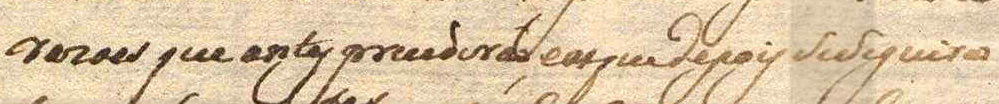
razoes que antes precederaõ, e as que depois se seguira
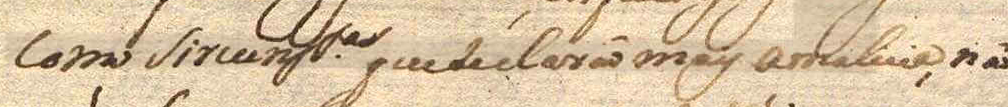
como sircuns.tas que declaraõ mais a malicia, naõ
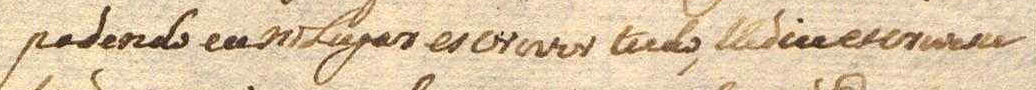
podendo eu no Lugar escrever tudo, lhe dice escrivesse
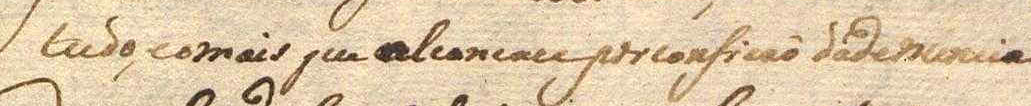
tudo, e o mais que alcancace por confiçaõ da denuncia
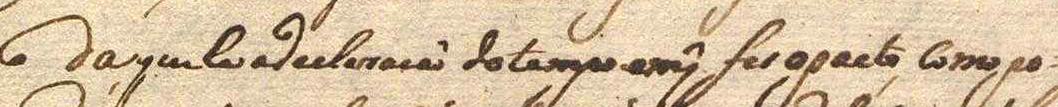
daquela declaraçaõ do tempo em q̄ fes o pacto, como po
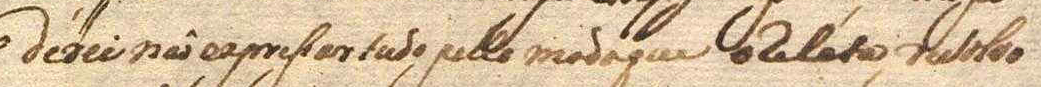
derei naõ expressar tudo pello modo que o relata, resolvo
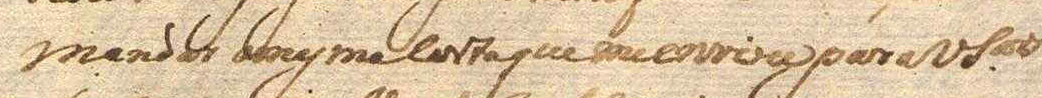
mandar a mesma carta que me enviou para VS.as
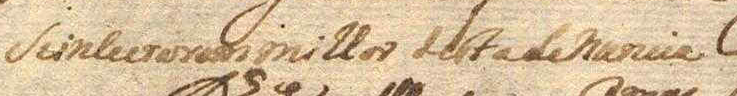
se incurerem milhor desta denuncia.
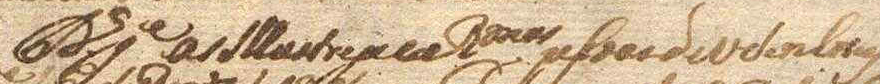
D.s g.e as Illustres e a R.mas pesoas de v Senhores
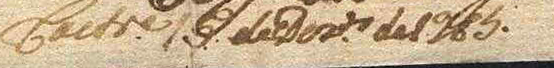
Caetr.e 15 de Dez.o de 1765.
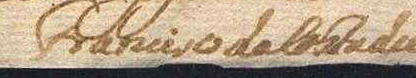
Francisco da Costa de
